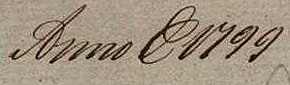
Anno d̄ 1799
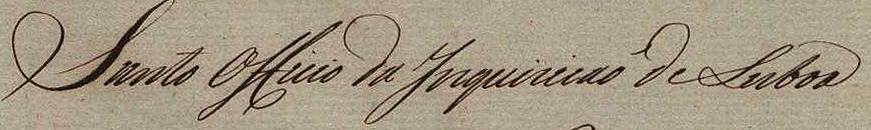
Santo Officio da Jnquiziçaõ de Lisboa
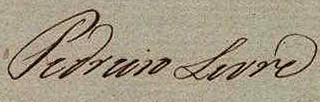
Pedreiro Livre
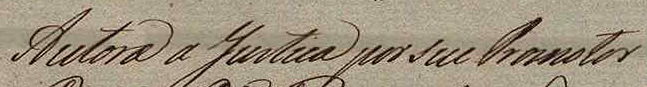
Autora a Justica por seu Promotor
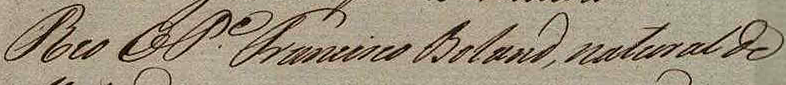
Reo O P.e Francisco Boland, natural de
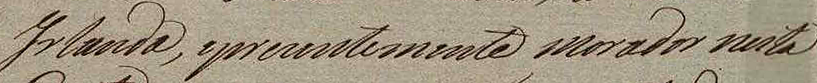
Jrlanda, e prezentemente morador nesta
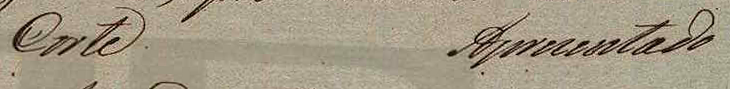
Corte Aprezentado
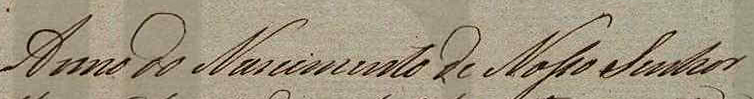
Anno do Nascimento de Nosso Senhor
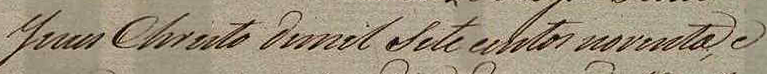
Jezus Christo de mil setecentos noventa, e
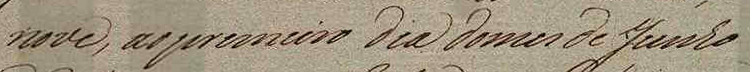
nove, ao premeiro dia do mes de Junho
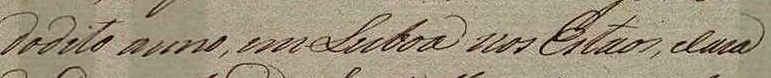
do dito anno, em Lisboa nos Estaos, e caza
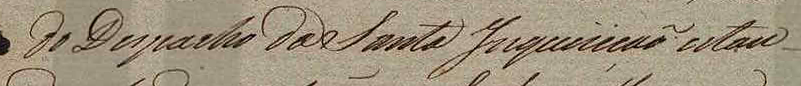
do Despacho da Santa Jnquisicaõ estan
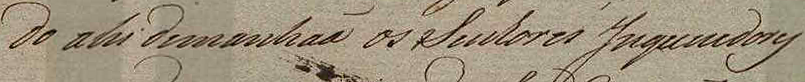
do ahi de manhaã os Senhores Jnquisidores
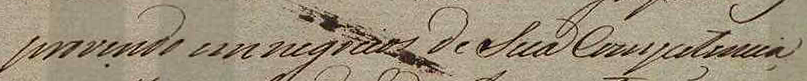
provendo em negocios de Sua Competencia,
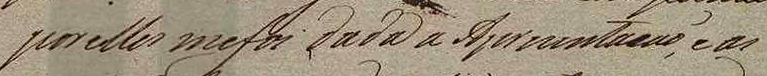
por elles me foi dada a Aprezentacaõ, e as
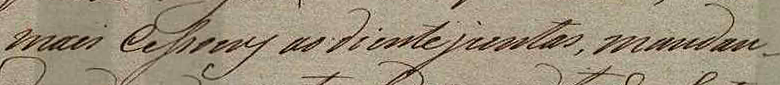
mais Cessoens ao diante juntas, mandan
